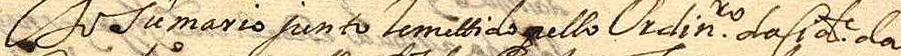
Do Sumario junto Remettido pello Ordin.ro da Cid̄.e da
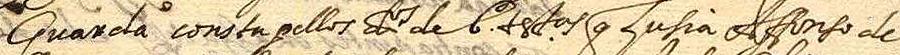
Guarda o consta pellos d̄.os de 6 test.as q̄ Lusia Affonso de
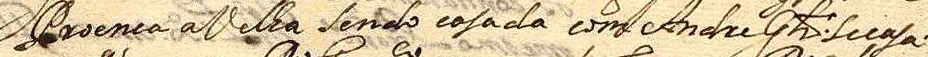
Proença a Velha sendo casada com Andre Glz̄ se casa
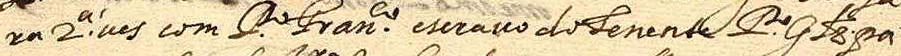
ra 2.a ues com P.o Fran.co escrauo do Tenente P.o Glz̄ pa
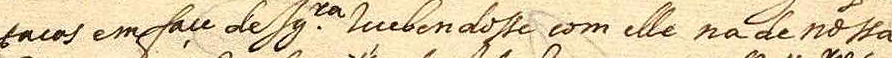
tacas em façe de Jg.ra recebendosse com elle na de nossa
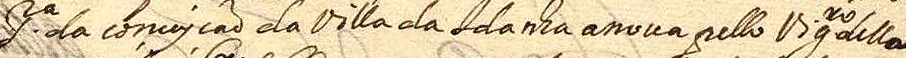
s.ra da conçeyção da Villa da Idanha a noua pello Vig.ro della
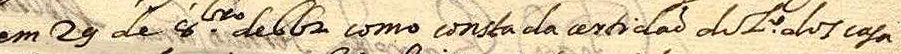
em 29 de 8.bro de 662 como consta da certidaõ do L.o dos casa
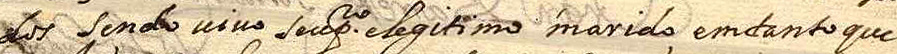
dos sendo uiuo seu p.ro e legitimo marido, em tanto que
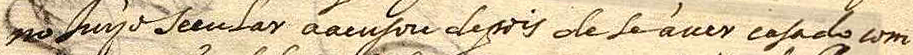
no Iuízo Secular a acusou depois de se áuer casado com
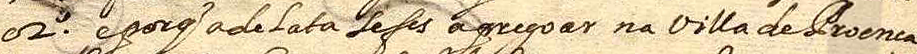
o 2.o e porq̄ a delata se fes apregoar na Villa de Proença
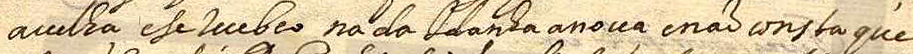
a uelha, e se Recebeo na da Idanha a noua, e naõ consta que
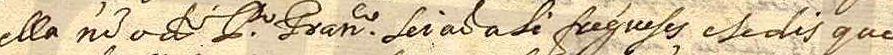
ella nẽ o d̄.o P.o Fran.co seiaõ ali fregueses, e se dis que
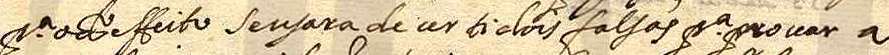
p.a o d̄.o effeito se usara de certidois falsas p.a prouar a
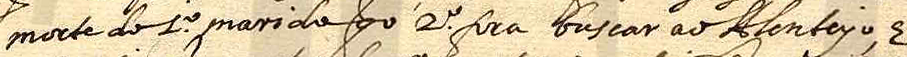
morte do 1.o marido q̄ o 2.o fora buscar ao Alenteyo, E
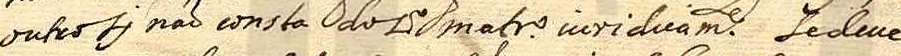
outrosj não consta do L.o matr.o iuridicam.te se deue
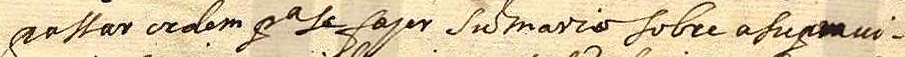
passar ordem p.a se fazer sūmario sobre a supraui
